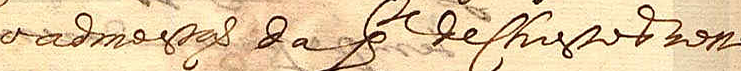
o admoestaõ da pte de Christo s̄ nosso
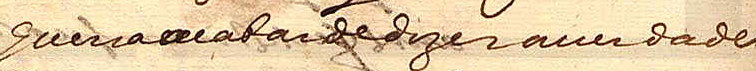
queira acabar de dizer a uerdade
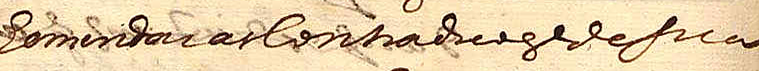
E emendar as Contradicoes de sua
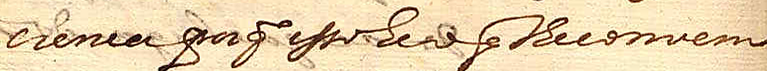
crenca porq̄ isso he o q̄ lhe convem
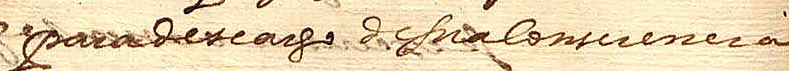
para descargo de sua consciencia
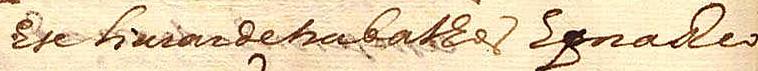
E se liurar de trabalhos E por o Reo
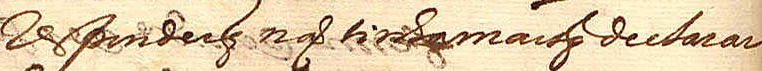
responder q̄ naõ tinha mais q̄ declarar
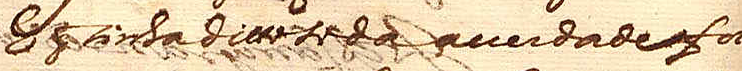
E q̄ tinha ditto toda a uerdade foi
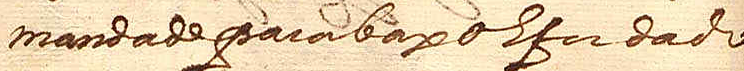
mandado para baxo E foi dado
